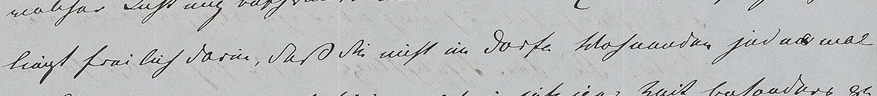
liegt freilich darin, daß die nicht im Dorfe Wohnenden jedesmal
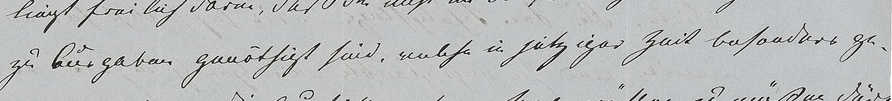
zu Ausgaben genöthigt sind, welche in jetziger Zeit besonders ge-
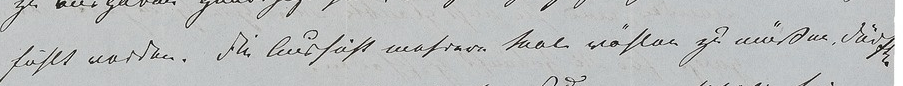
fühlt werden. Die Aussicht mehrere Male wählen zu müßen, dürfte
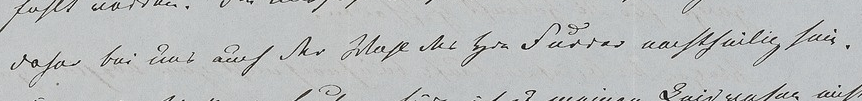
daher bei uns auch der Wahl des Hrn Furrer nachtheilig sein.
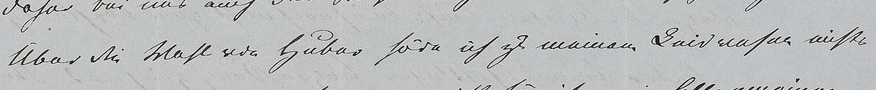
Über die Wahl von Huber höre ich zu meinem Leidwesen nichts
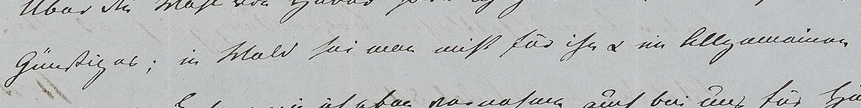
Günstiges; in Wald sei man nicht für ihn & im Allgemeinen
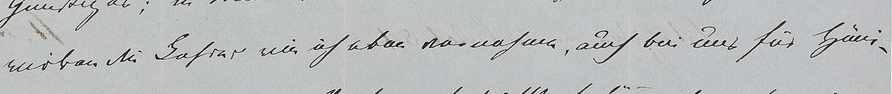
wirken die Lehrer wie ich eben vernehme, auch bei uns für Häni--
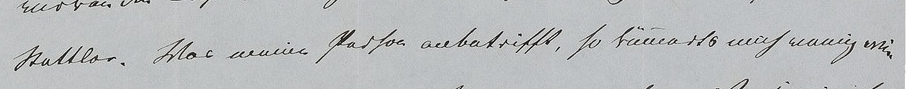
Stettler. Was meine Person anbetrifft, so kümmerts mich wenig wie
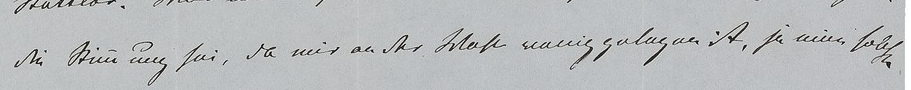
die Stimmung sei, da mir an der Wahl wenig gelegen ist, ja eine solche
